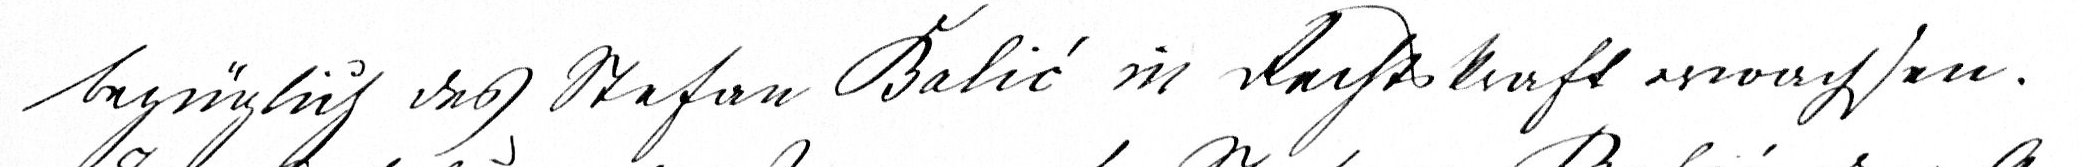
bezüglich des Stefan Balić in Rechtskraft erwachsen.
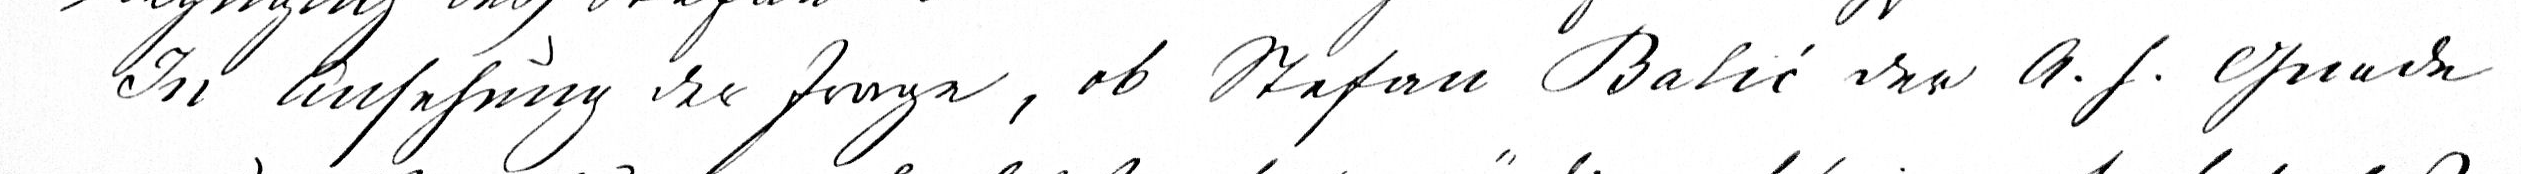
In Ansehung der Frage, ob Stefan Balić der A.h. Gnade
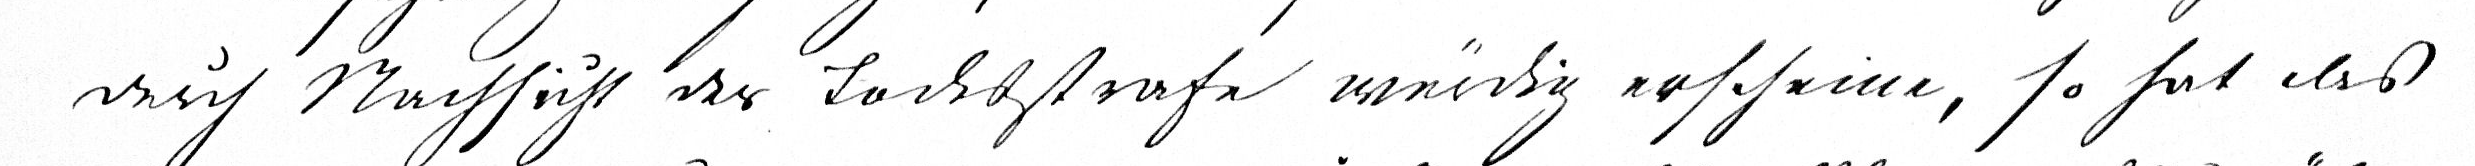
durch Nachsicht der Todesstrafe würdig erscheine, so hat das
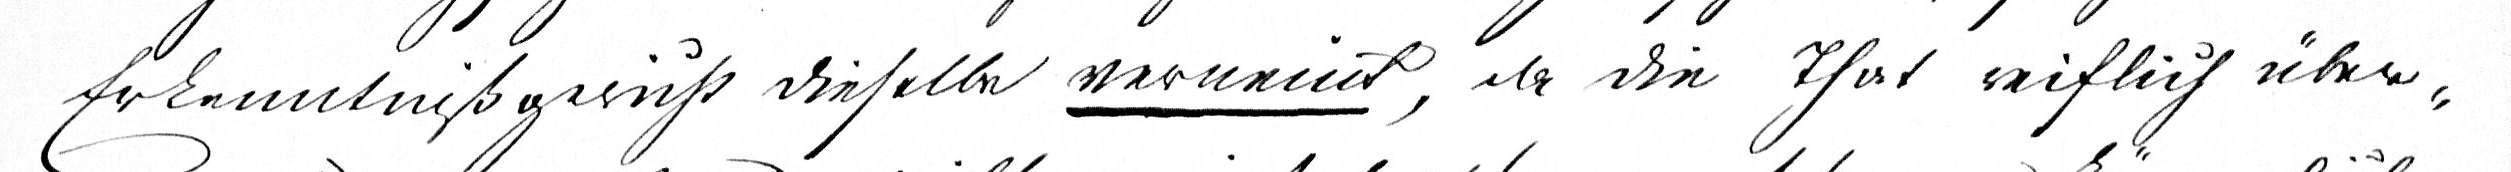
Erkenntnißgericht dieselbe verneint, xx die That reiflich über¬
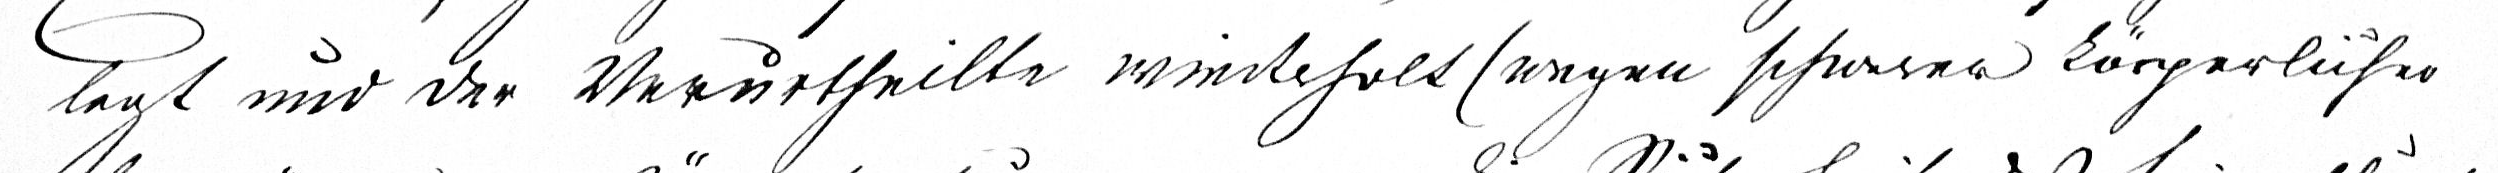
legt und der Verurtheilte windeholt (engen schwerer körperlicher
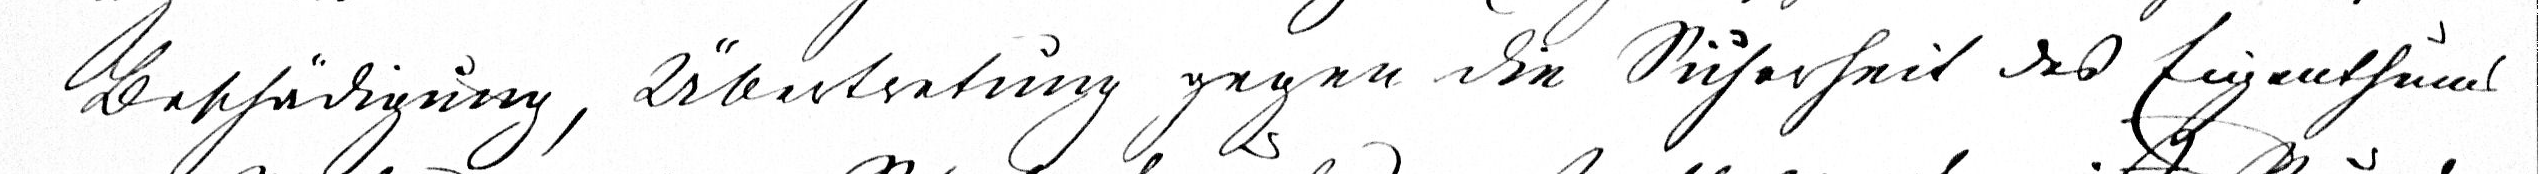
Beschädigung, Übertretung gegen die Sicherheit des Eigenthums
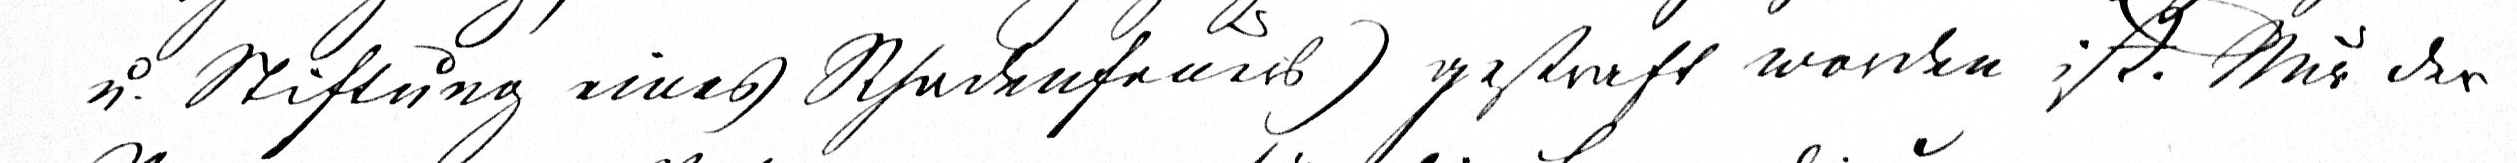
u. Stiftung eines Schadenfraus) gestraft worden ist. Nur der
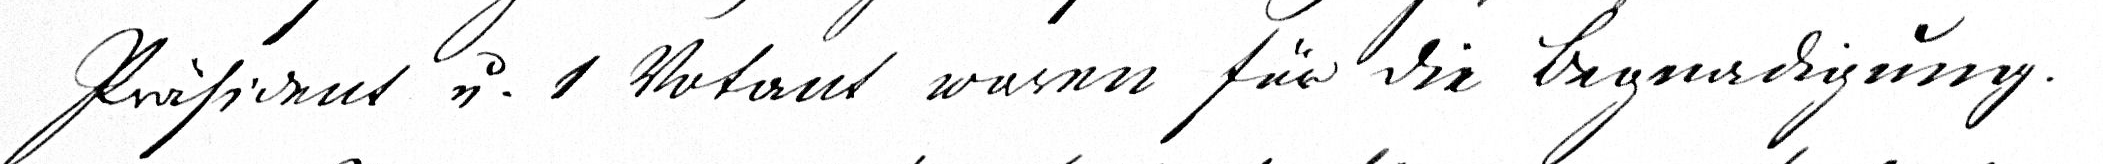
Präsident u. 1 Votant waren für die Begnadigung.
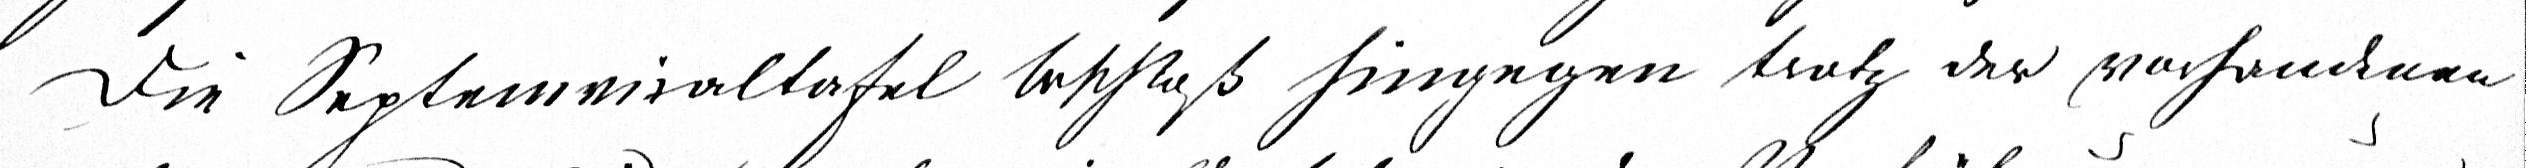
Die Septemvialtafel beschloß hingegen trotz der vorhandenen
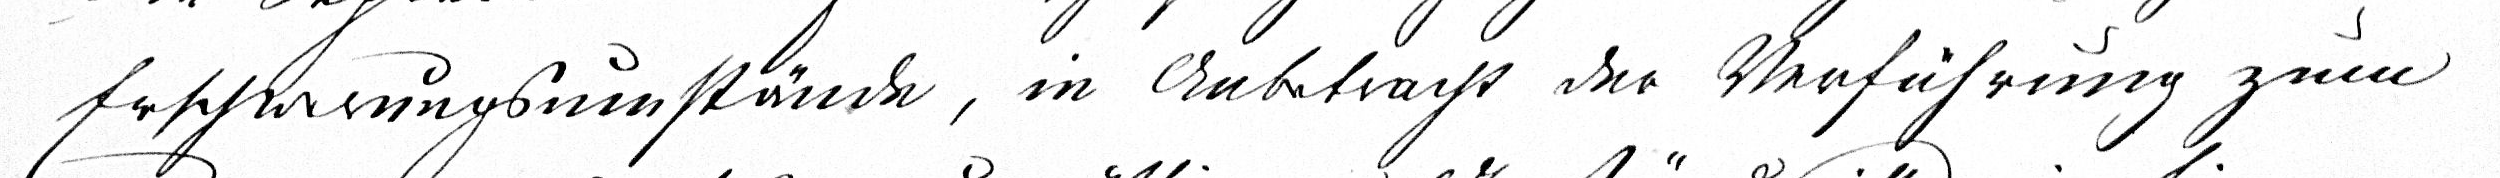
Erschwerungsumstände, in Anbetracht der Verführung zum
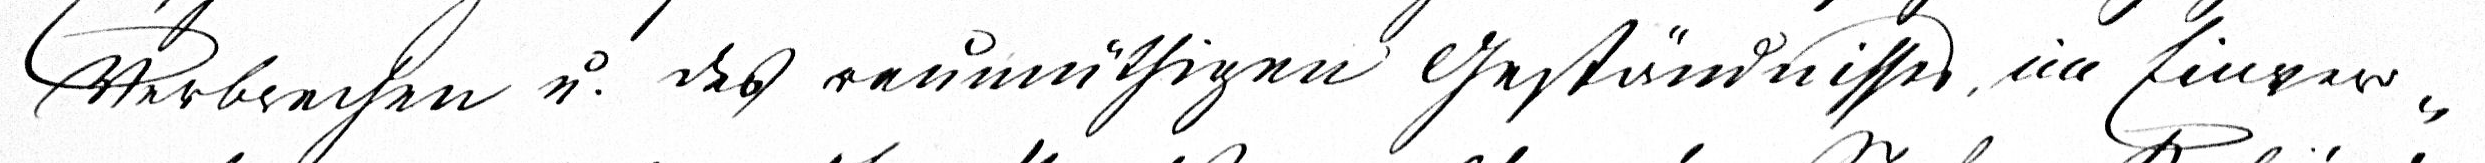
Verbrechen u. des reumüthigen Geständnisses, im Einver¬
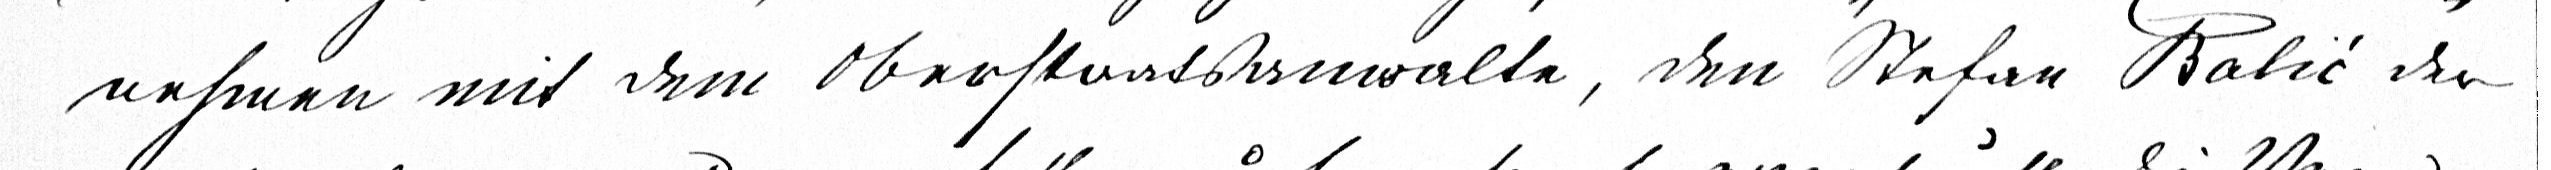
nehmen mit dem Oberstaatsanwalte, den Stefan Balić der
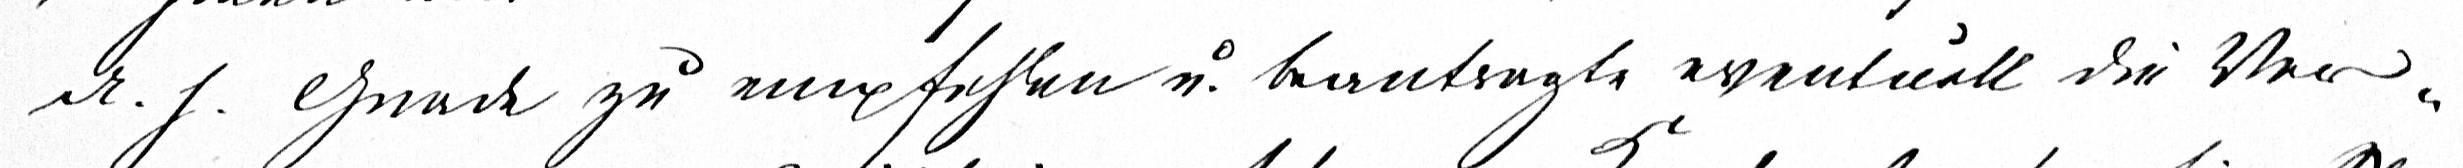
A. h. Gnade zu empfehlen u. beantragte eventuell die Ver¬
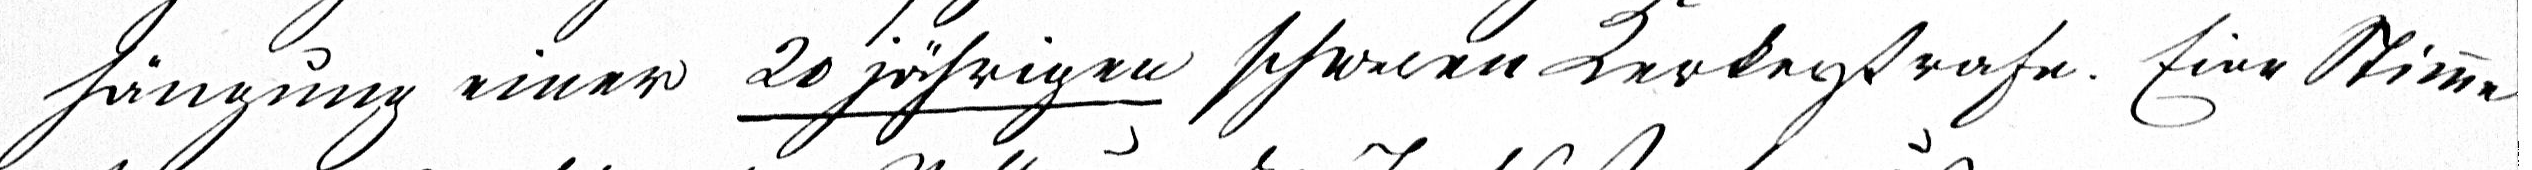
hängung einer 20jährigen schweren Kerkerstrafe. Eine Stimme
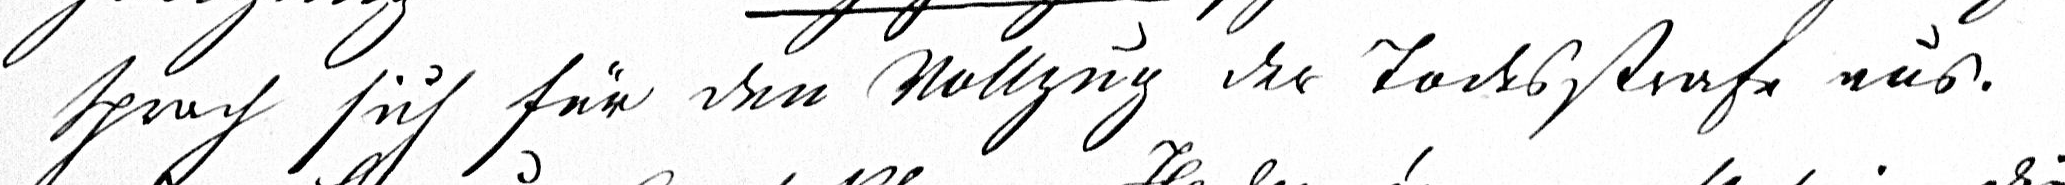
sprach sich für den Vollzug der Todesstrafe aus.
